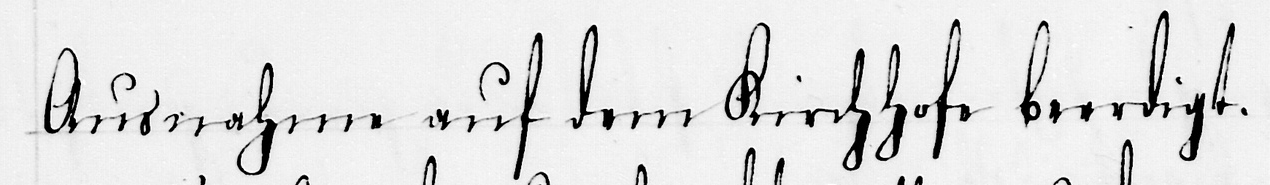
Ausnahme auf dem Kirchhofe beerdigt.
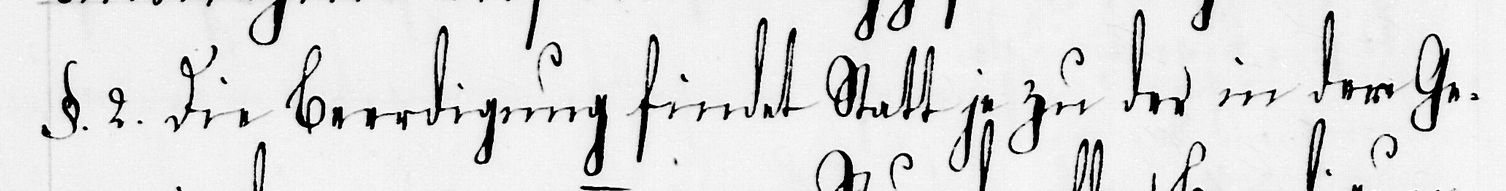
§. 2. Die Beerdigung findet Statt je zu der in der Ge¬
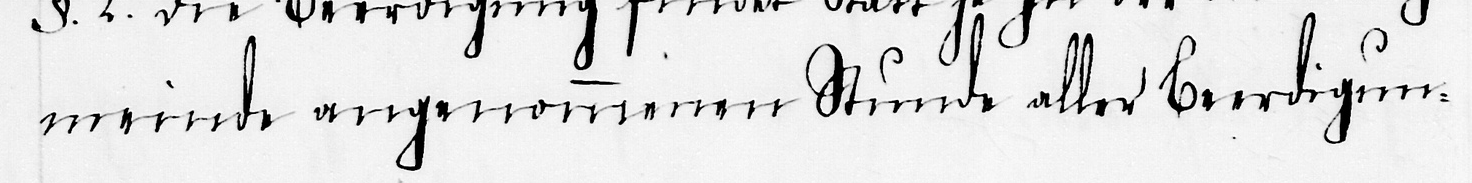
meinde angenommenen Stunde aller Beerdigun¬
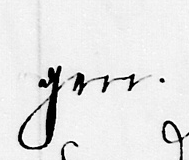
gen.
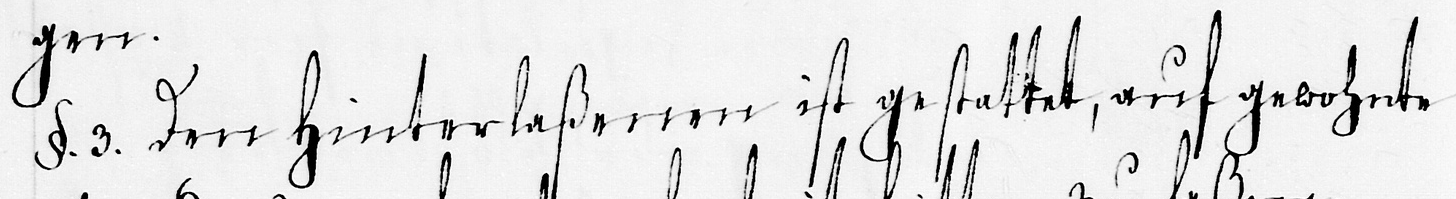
§. 3. Den Hinterlaßenen ist gestattet, auf gewohnte
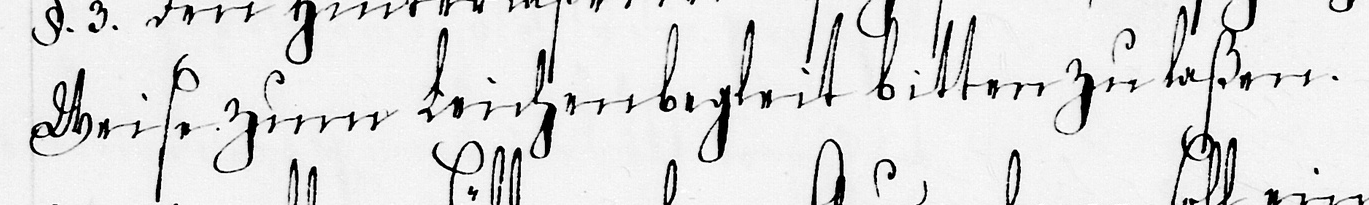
Weise zum Leichenbegleit bitten zu laßen.
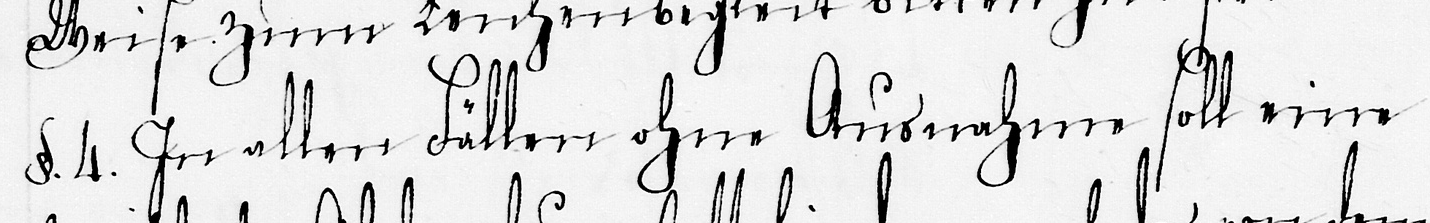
§. 4. In allen Fällen ohne Ausnahme soll eine
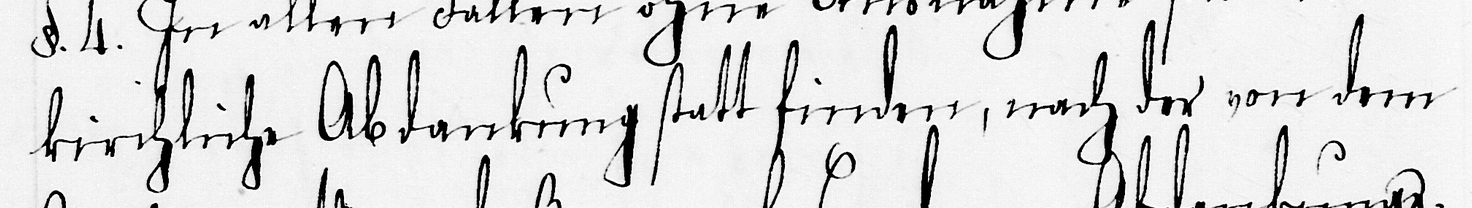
kirchliche Abdankung statt finden, nach der von dem
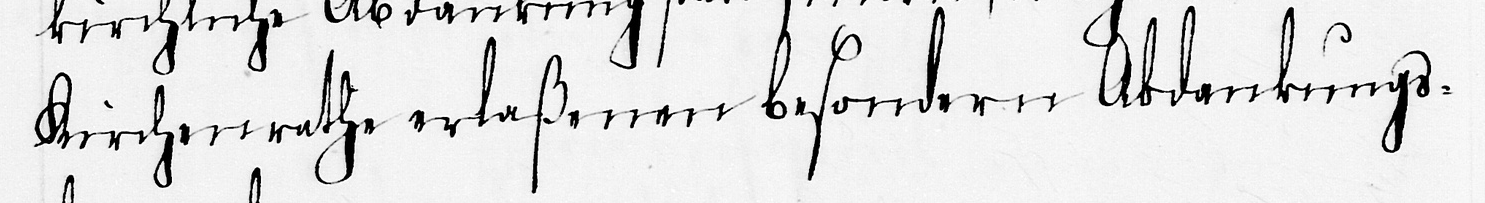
Kirchenrathe erlaßenen besondern Abdankungs¬
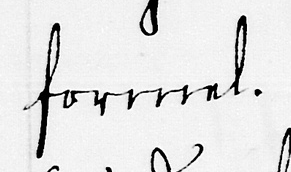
formel.
